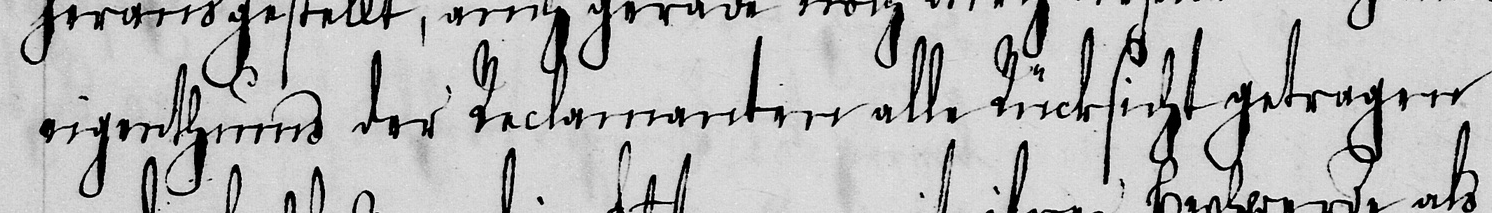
eigenthums der Reclamanten alle Rücksicht getragen
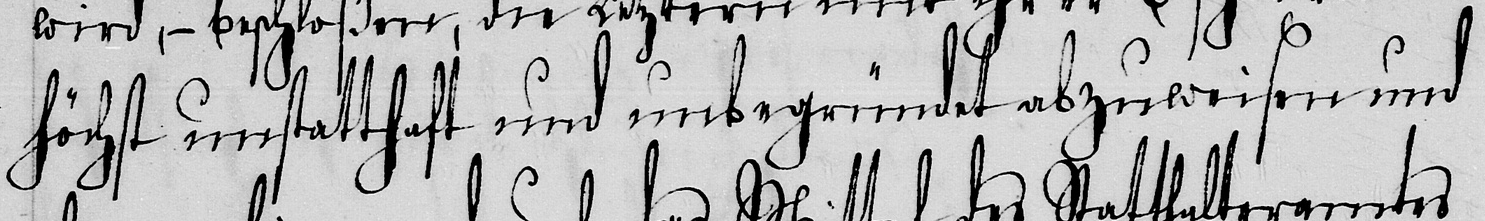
höchst unstatthaft und unbegründet abzuweisen und
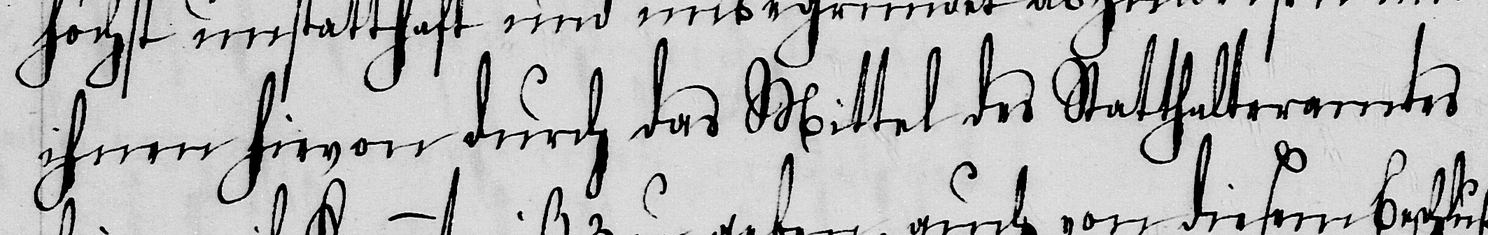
ihnen hievon durch das Mittel des Statthalteramtes
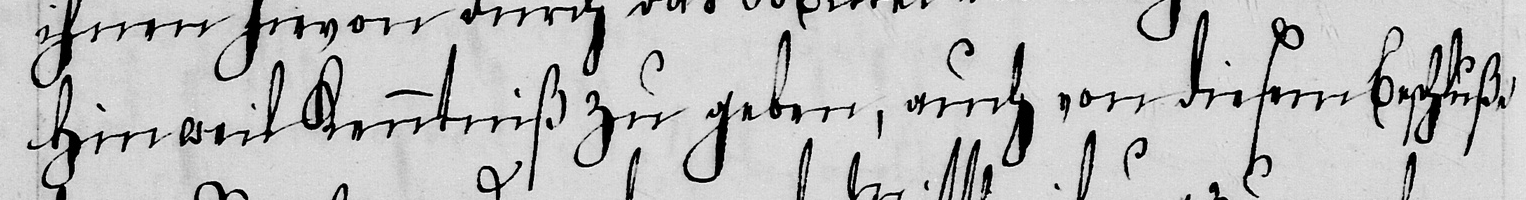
Hinweil Kenntniß zu geben, auch von diesem Beschluße
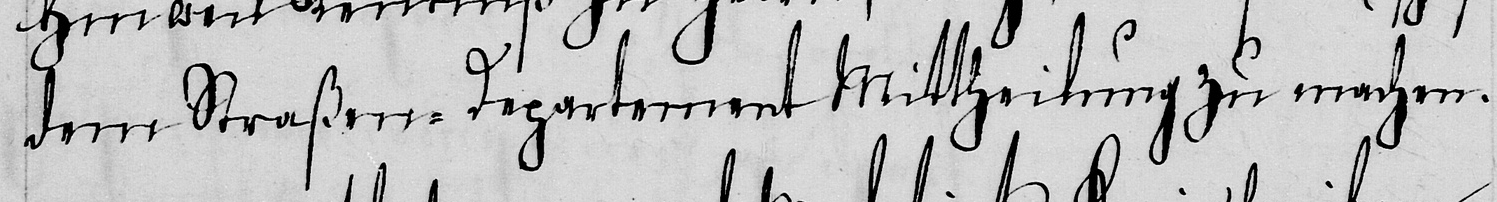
dem Straßen-Departement Mittheilung zu machen.
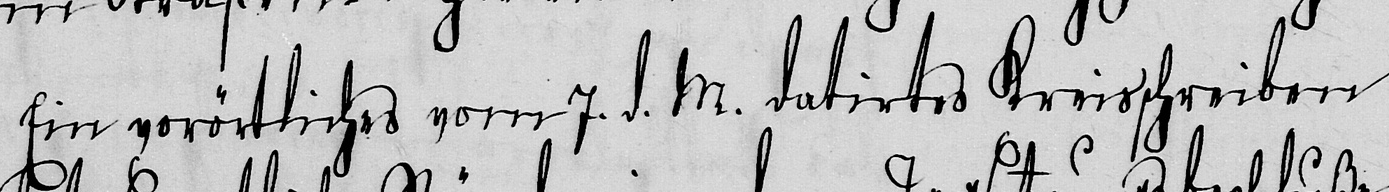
Ein vorörtliches vom 7. d. M. datirtes Kreisschreiben
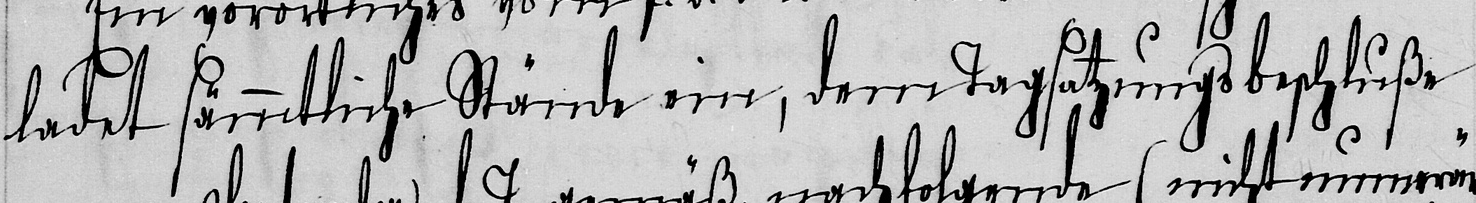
ladet sämmtliche Stände ein, dem Tagsatzungsbeschluße
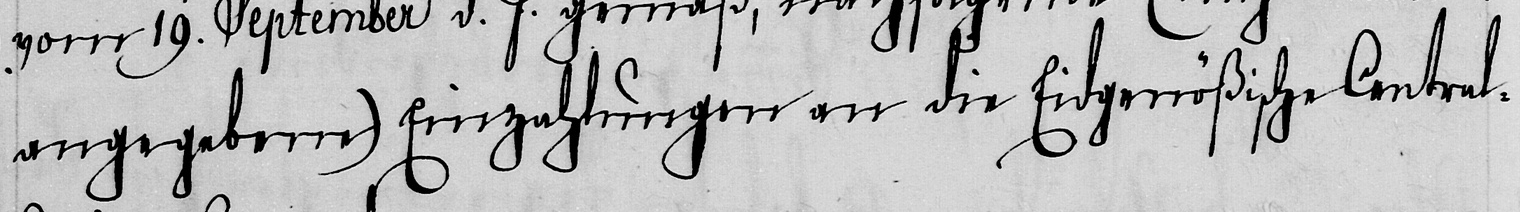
angegebene) Einzahlungen an die Eidgenößische Centra¬
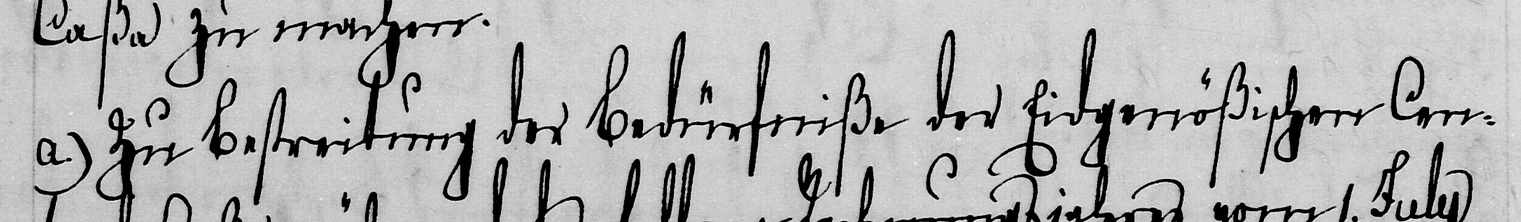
a.) Zu Bestreitung der Bedürfniße der Eidgenößischen Cen¬
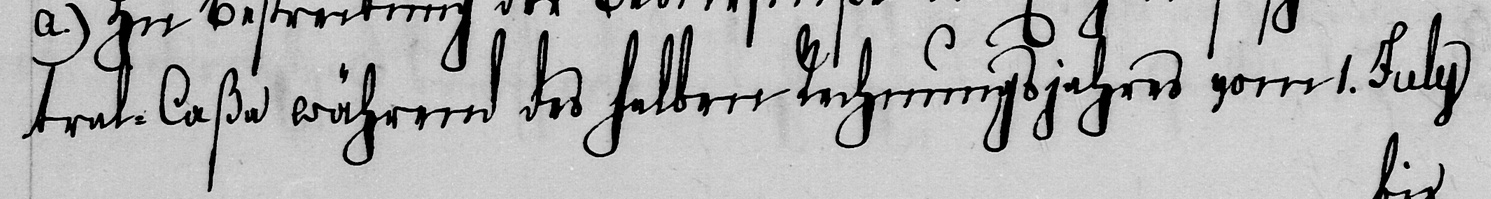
tral-Caßa während des halben Regierungsjahres vom 1. July
